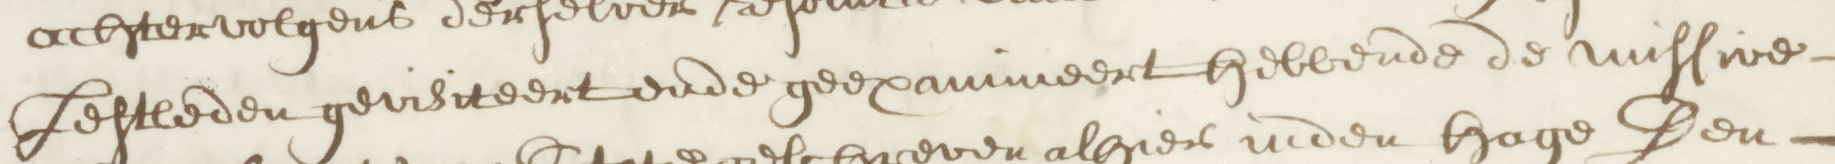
Lestleden gevisiteert ende geexamineert hebbende de missive
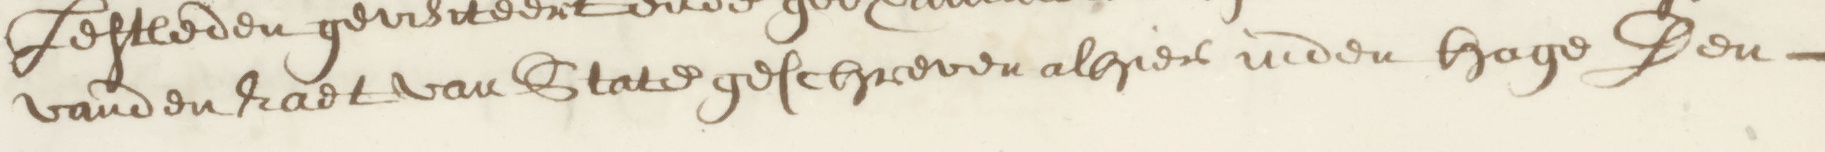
vanden raet van State geschreven alhier in den Hage Den —
